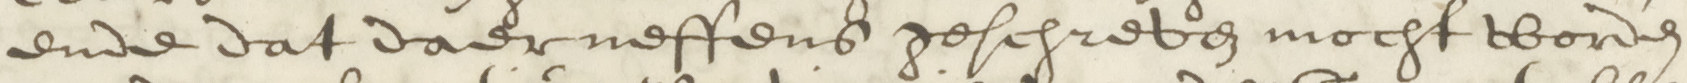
ende dat daerneffens geschreven mocht worden
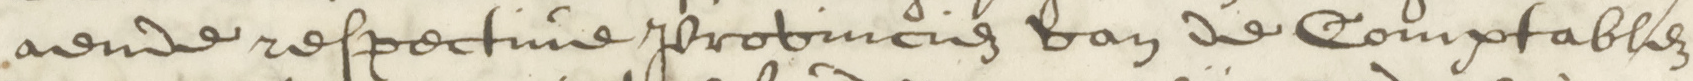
aende respectiue Provincien van de Comptablen
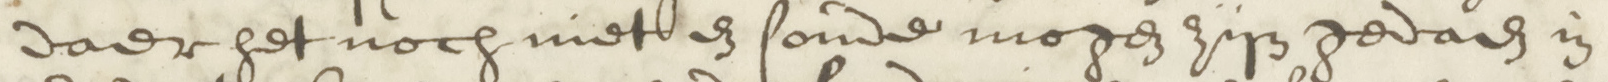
daer het noch niet en soude mogen zijn gedaen in
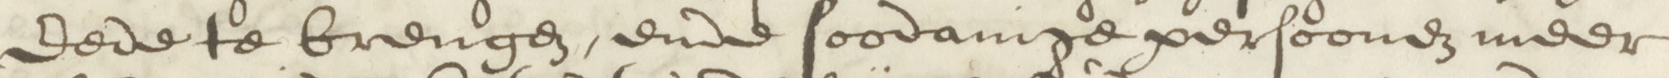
Eede te brengen, ende soodanige persoonen meer
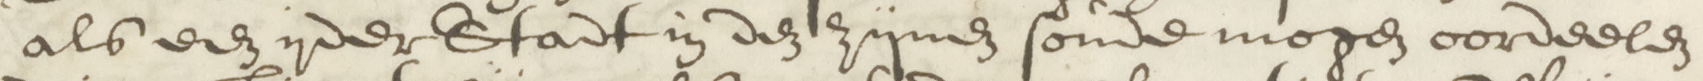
als een ijder Stadt in den zijnen soude mogen oordeelen
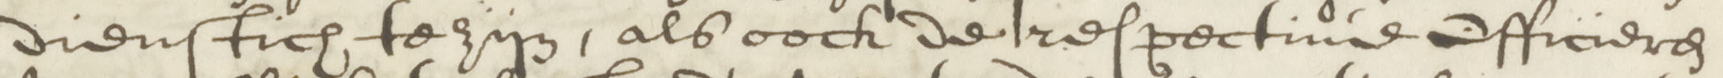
dienstich te zijn, als oock de respectiue Officieren
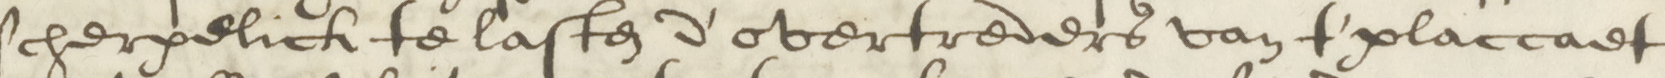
scherpelick te lasten d'overtreders van t'placcaet
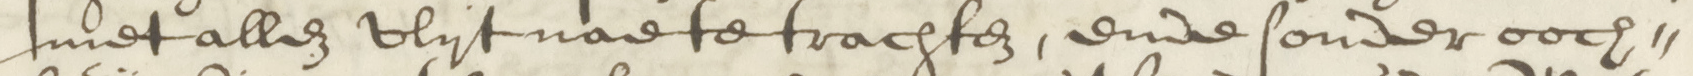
met allen vlijt nae te trachten, ende sonder ooch„
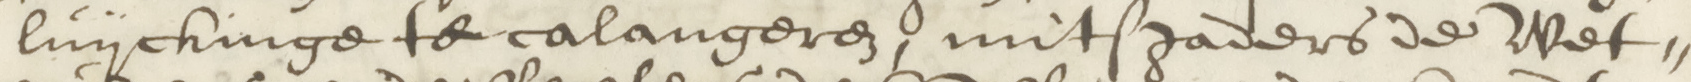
luijckinge te calangeren, mitsgaders de Wet„
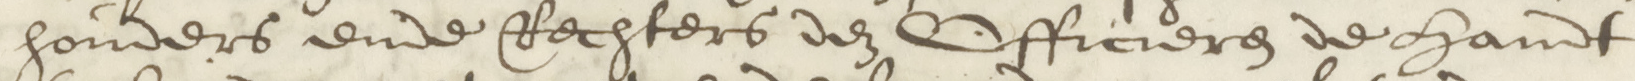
houders ende Rechters den Officieren de handt
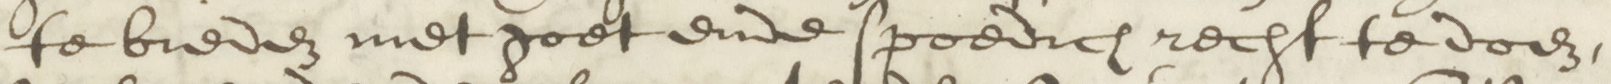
te bieden met goet ende spoedich recht te doen,
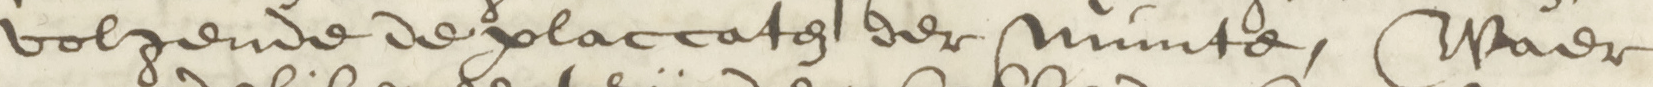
volgende de placcaten der Munte. Waer
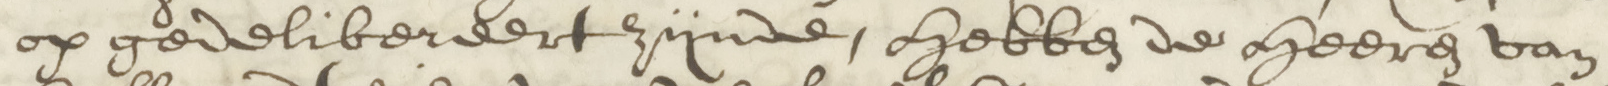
op gedelibereert zijnde, hebben de heeren van
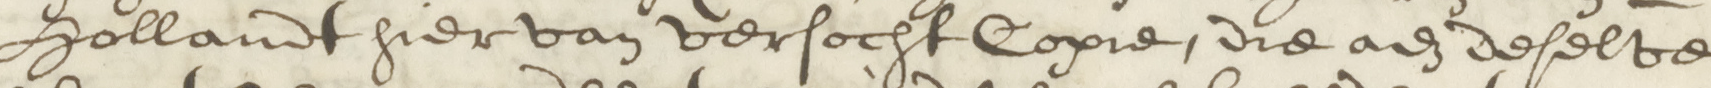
Hollandt hier van versocht Copie, die aen deselve
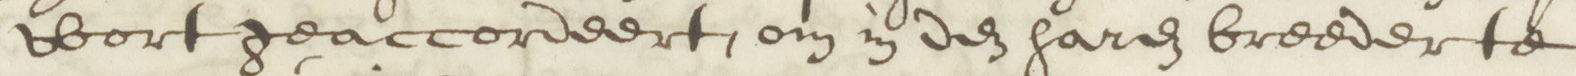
wort geaccordeert, om in den haren breeder te
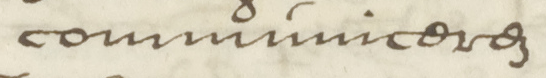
communiceren.
